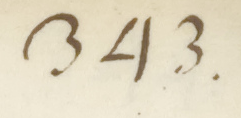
343.
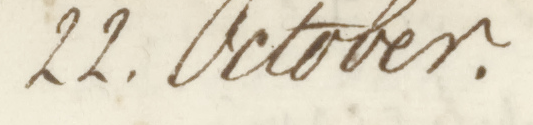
22. October.
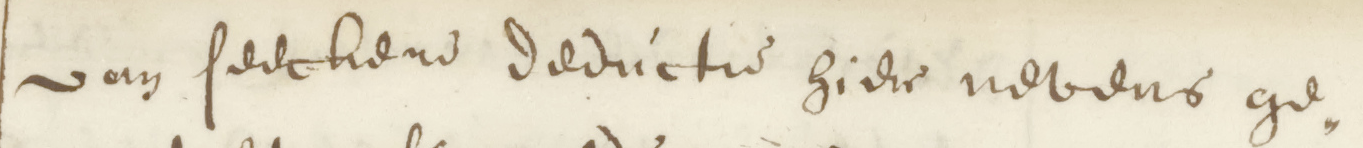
van seeckere deductie hier nevens ge„
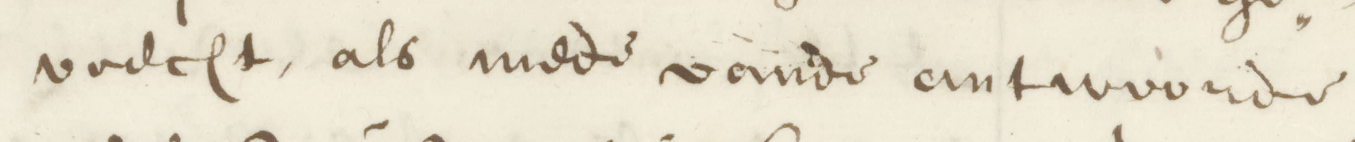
voecht, als mede vande antwoorde
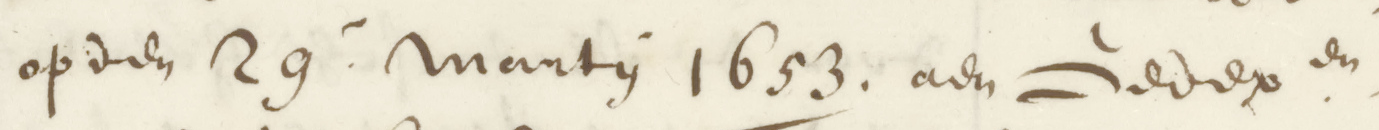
opden 29e. Martij 1653. aen Gedepen.
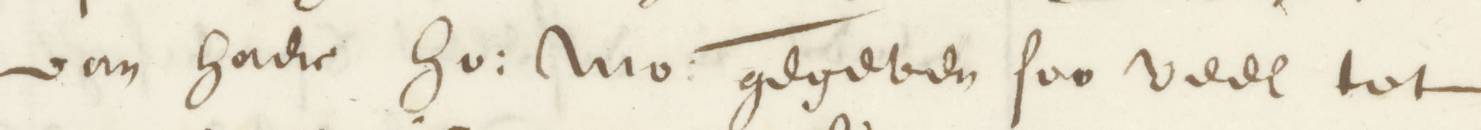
van haer Ho:Mo: gegeven soo veel tot
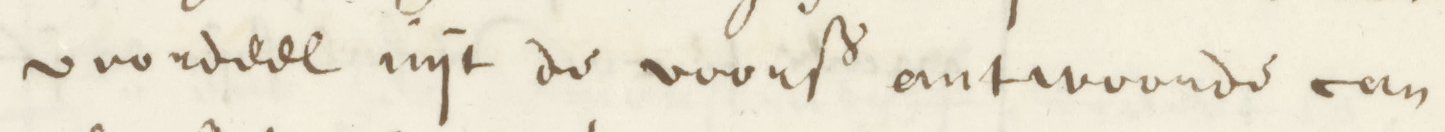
voordeel uijt de voors antwoorde can
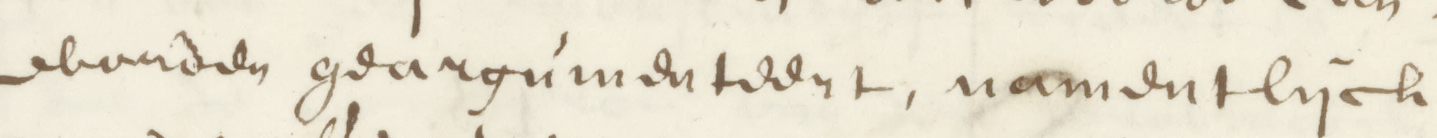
worden geargumenteert, namentlijck
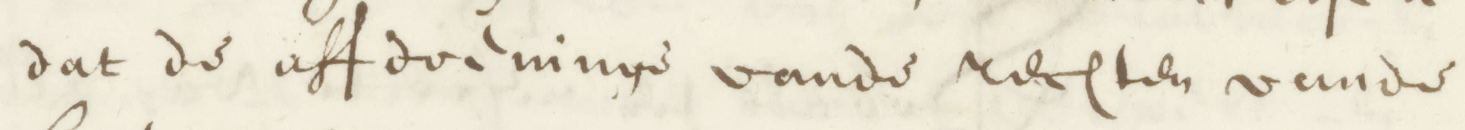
dat de affdoeninge vande rechten vande
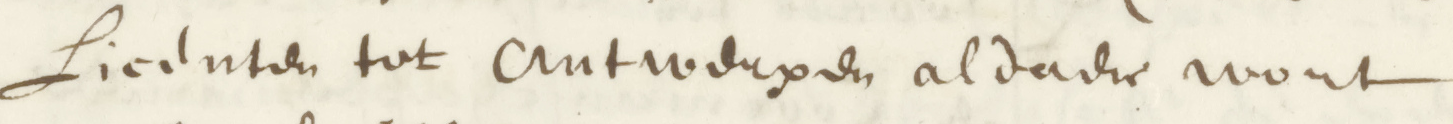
Licenten tot Antwerpen aldaer wort
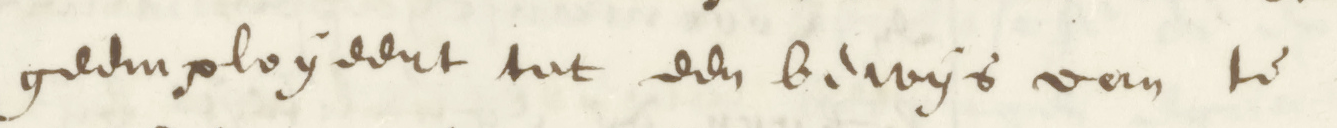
geemploijeert tot een bewijs van te
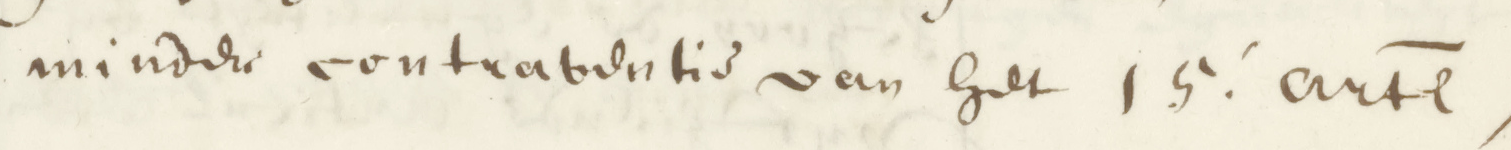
minder contraventie van het 15e. artl.
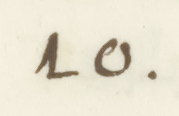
10.
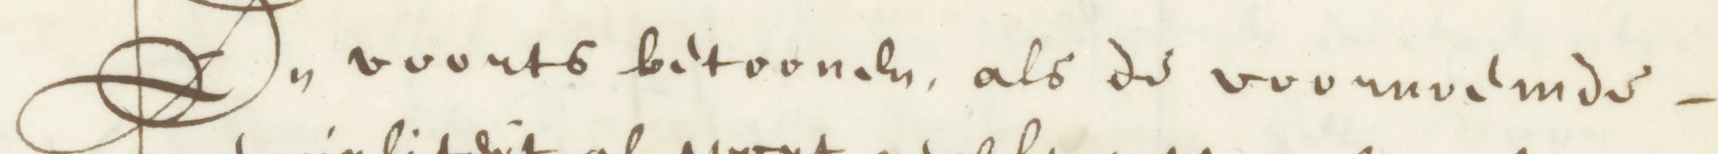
En voorts betoonen, als de voornoemde
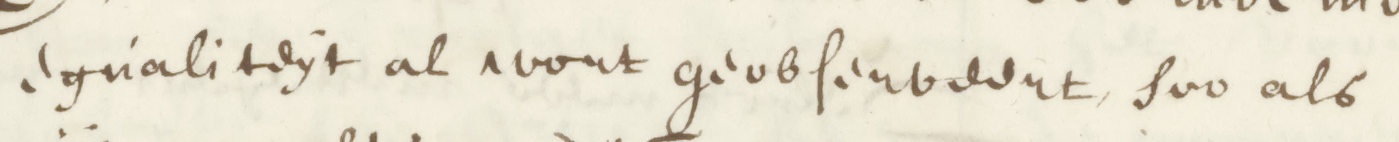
egualiteijt al wort geobserveert, soo als
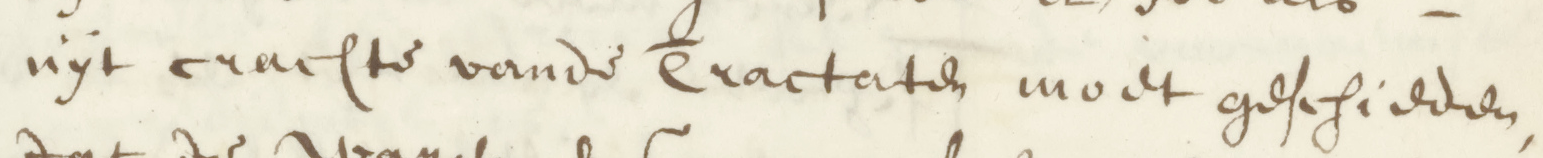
uijt crachte vande Tractaten moet geschieden,
